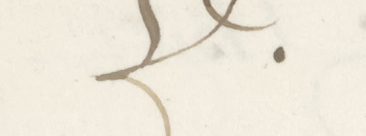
V.
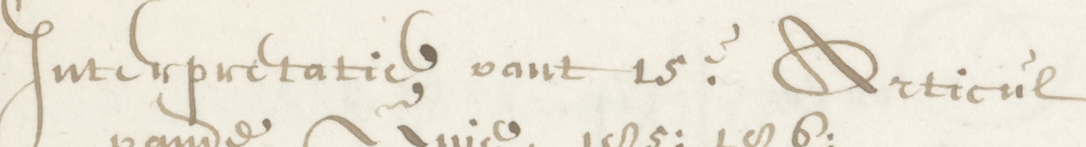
Interpretatie vant 15e. Articul
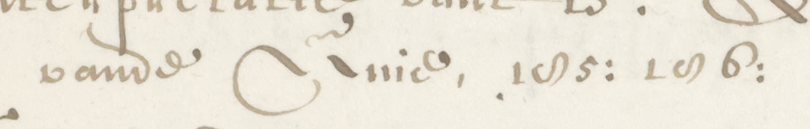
vande Unie, 185: 186:
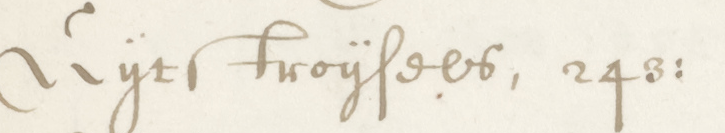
Uijtstroijsels, 243:
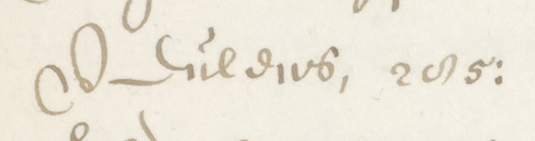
Veulens, 285:
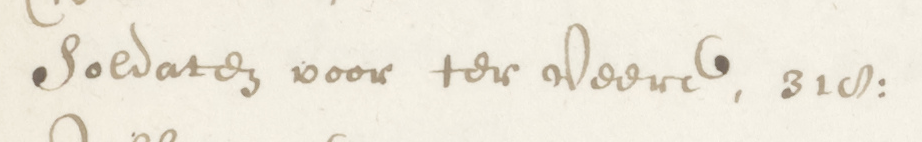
Soldaten voor ter Veere, 318:
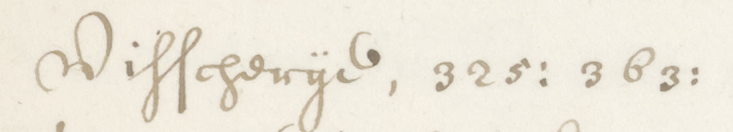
Visscherije, 325: 363:
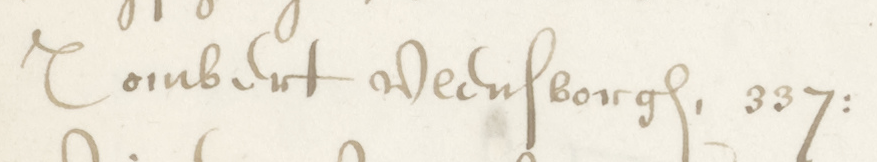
Rombert Veensborgh, 337:
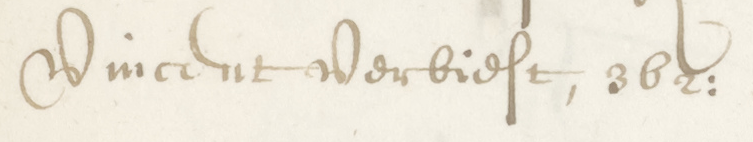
Vincent Verbiest, 362:
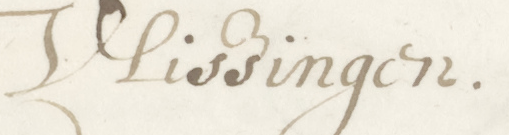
Vlissingen.
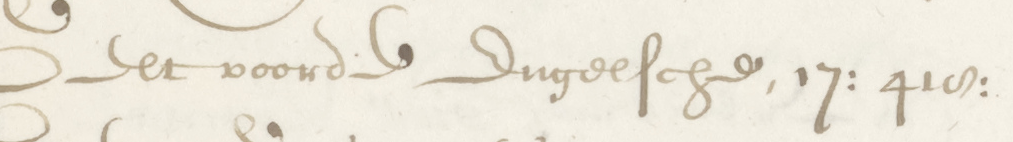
Gelt voorde Engelsche, 17: 418:
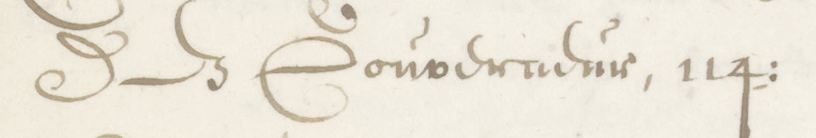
Den Gouverneur, 114:
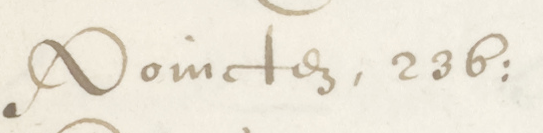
Poincten, 236:
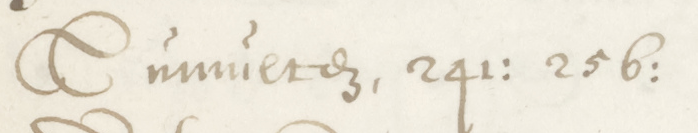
Tumulten, 241: 256:
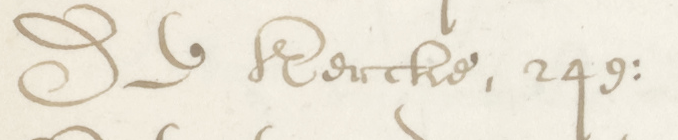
De Kercke, 249:
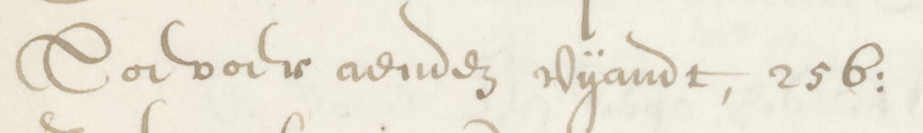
Toevoer aenden Vijandt, 256:
